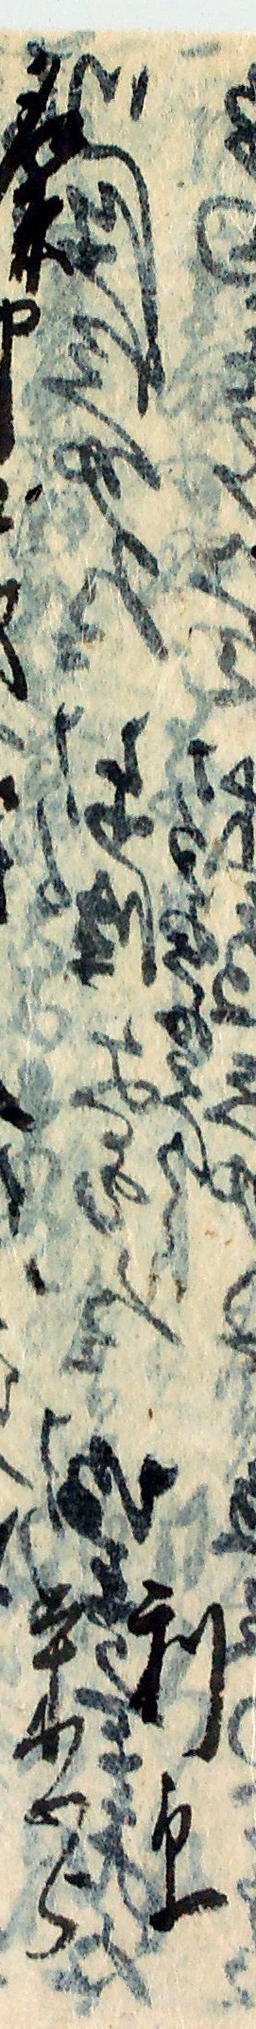与三郎
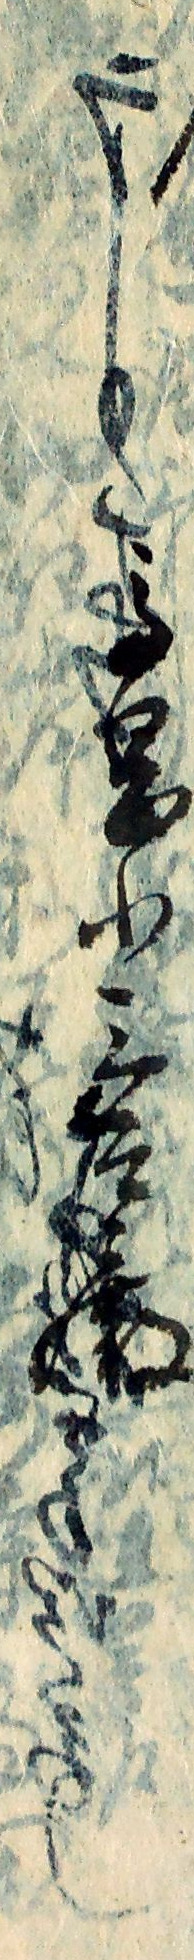高岡小三太殿
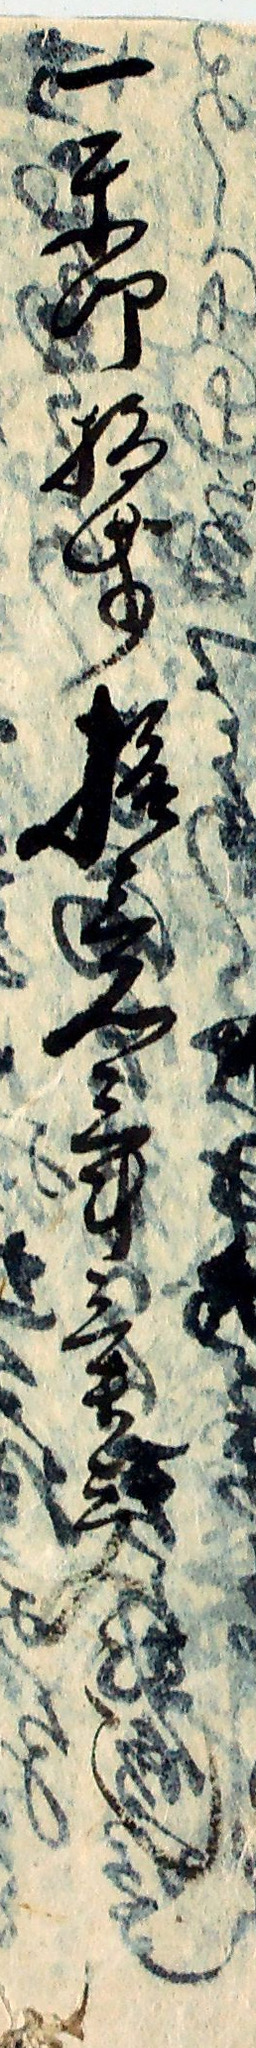一米御指紙拾三石三斗三升三合
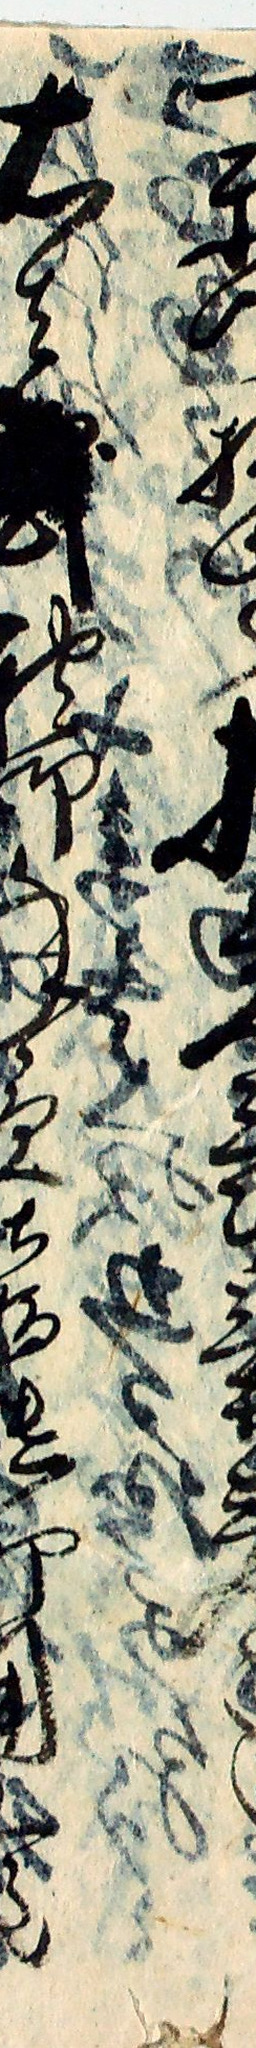右は当秋御年貢御指継御用金
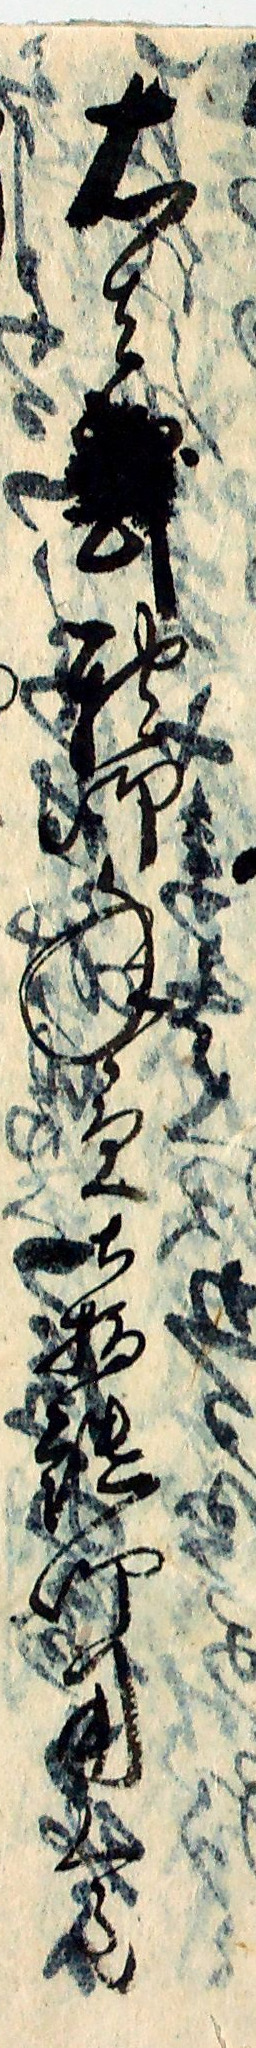右は当秋御年貢御指継御用金
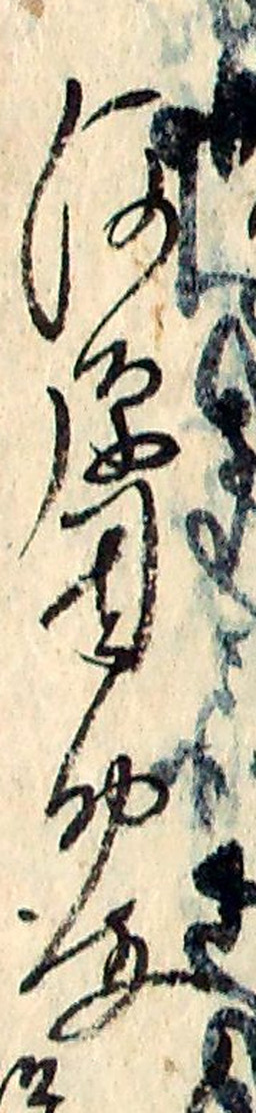河原周助殿

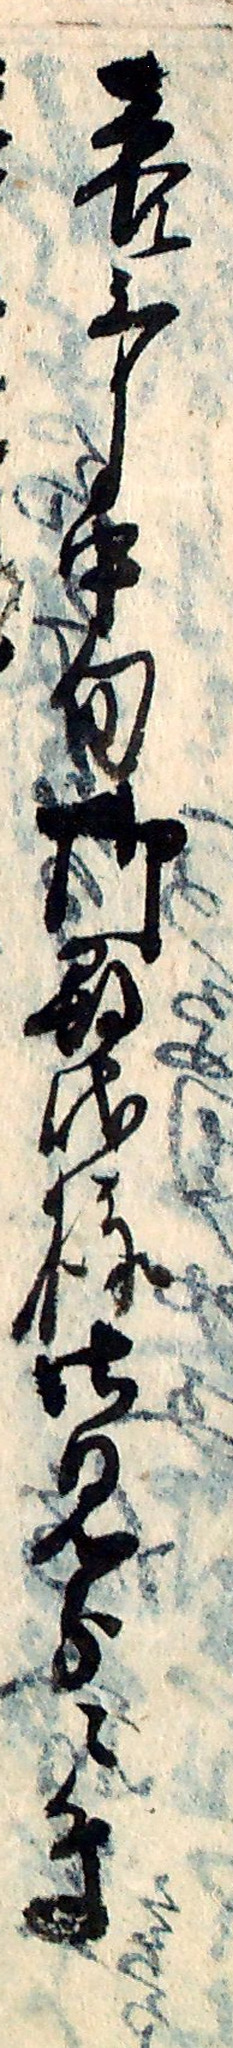来る三月中旬御郡代様御見分に付
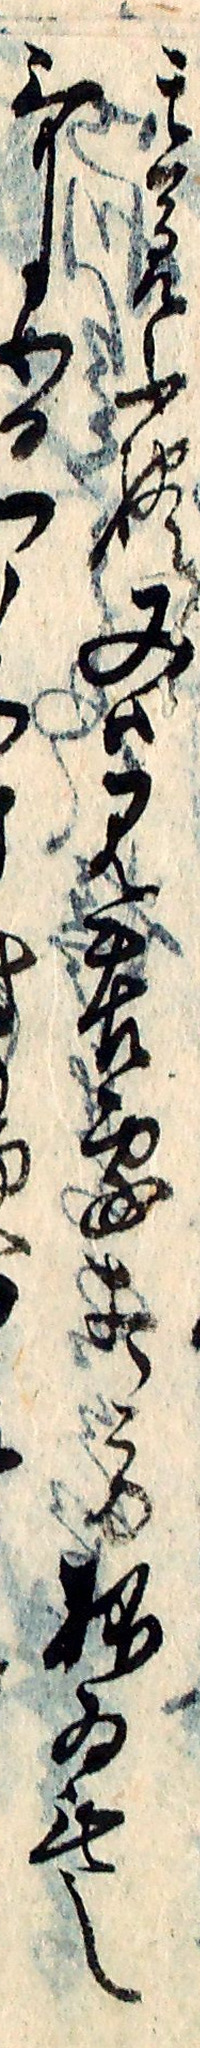其節不礼又は見苦敷打方抔為無之
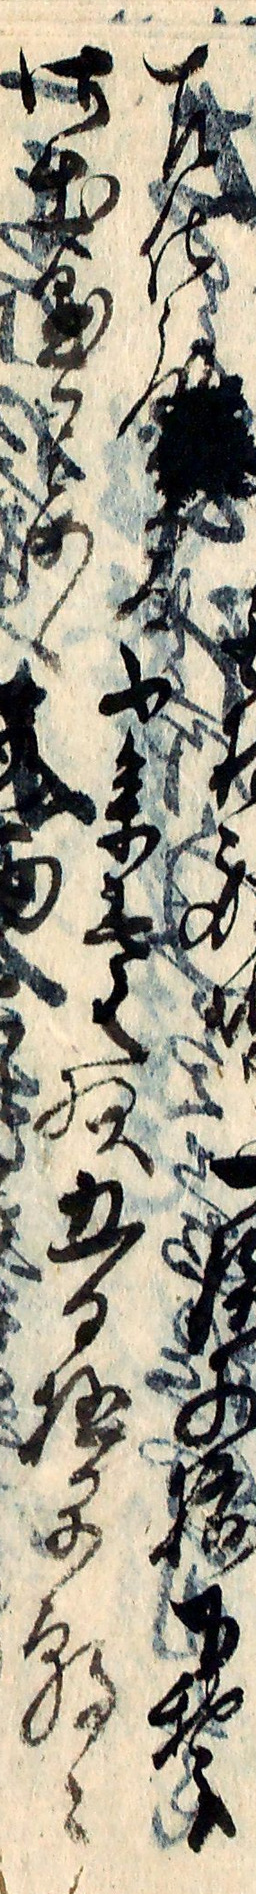古仕度義不参無之様五日極早朝に
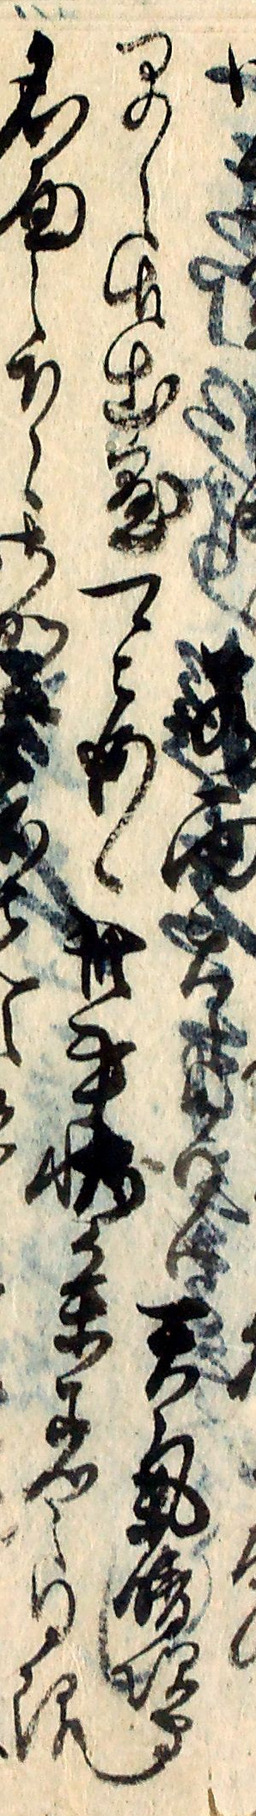早々御出懸可被成候此書状参着之日限
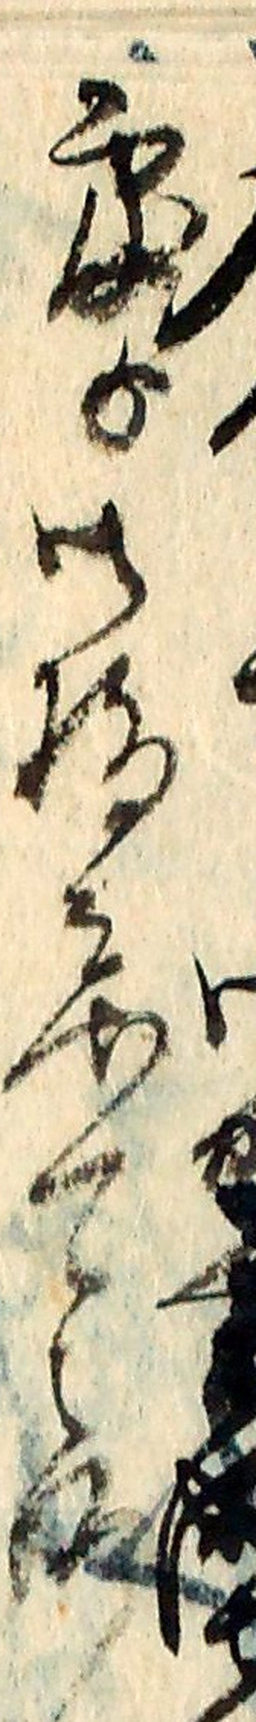処ゟ御指戻可被成候
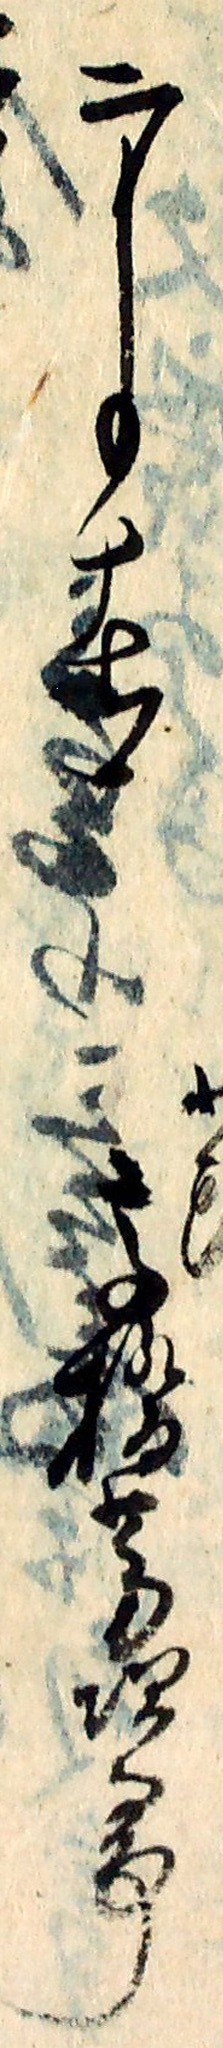二月十七日高橋芳次郎
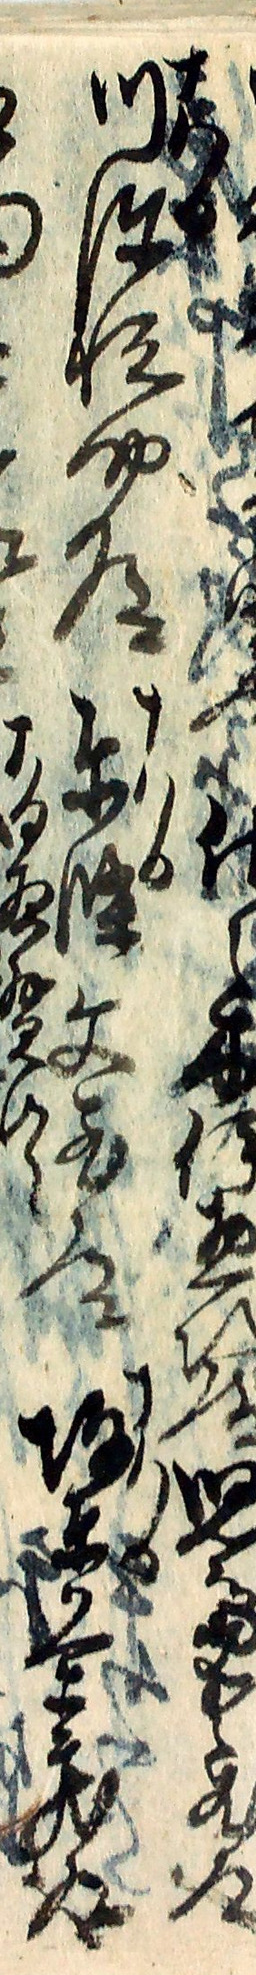川添悦助殿東条文蔵殿坂東粂蔵殿
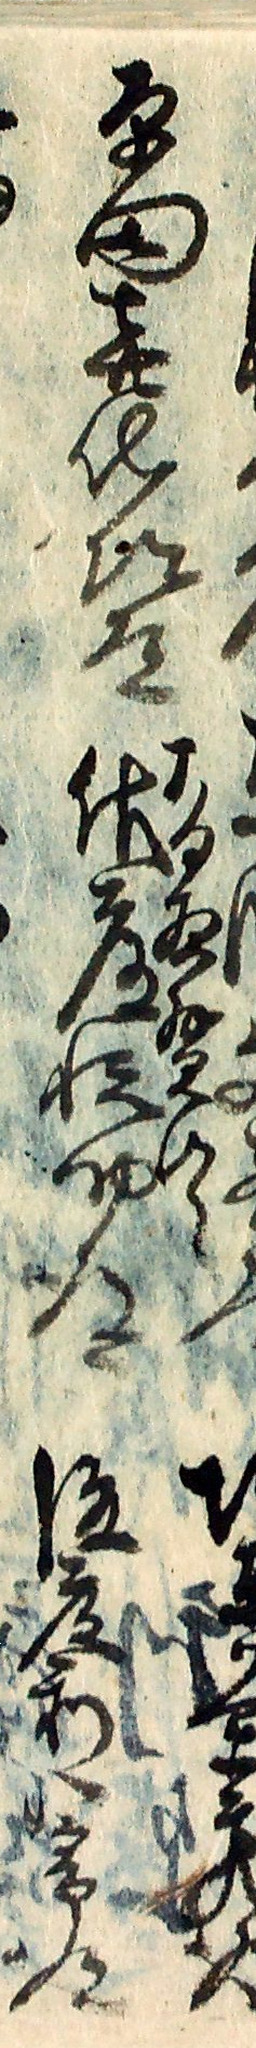原田喜代次殿十八日夜拝見仕候後藤利八郎殿
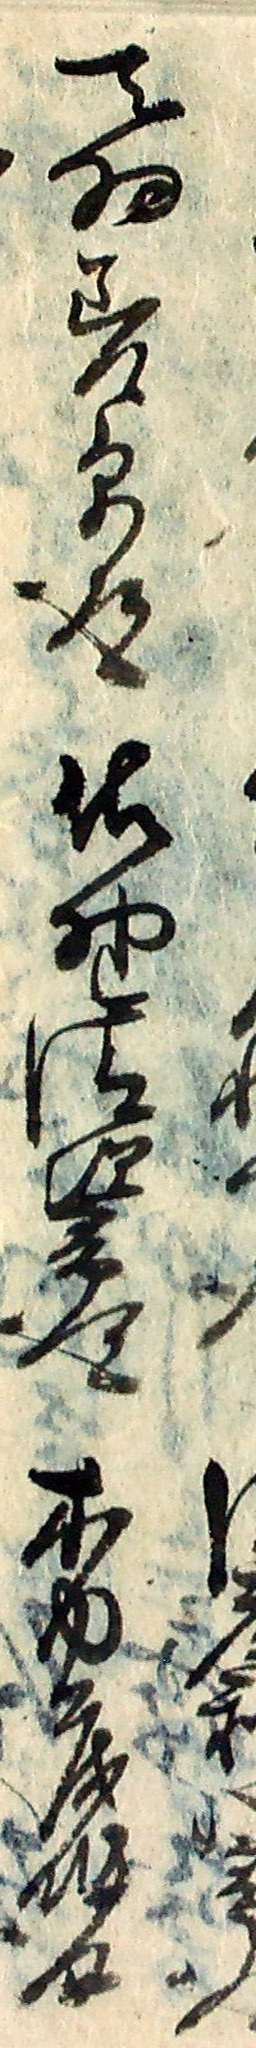天羽善兵衛殿佐藤悦助殿木内茂作殿
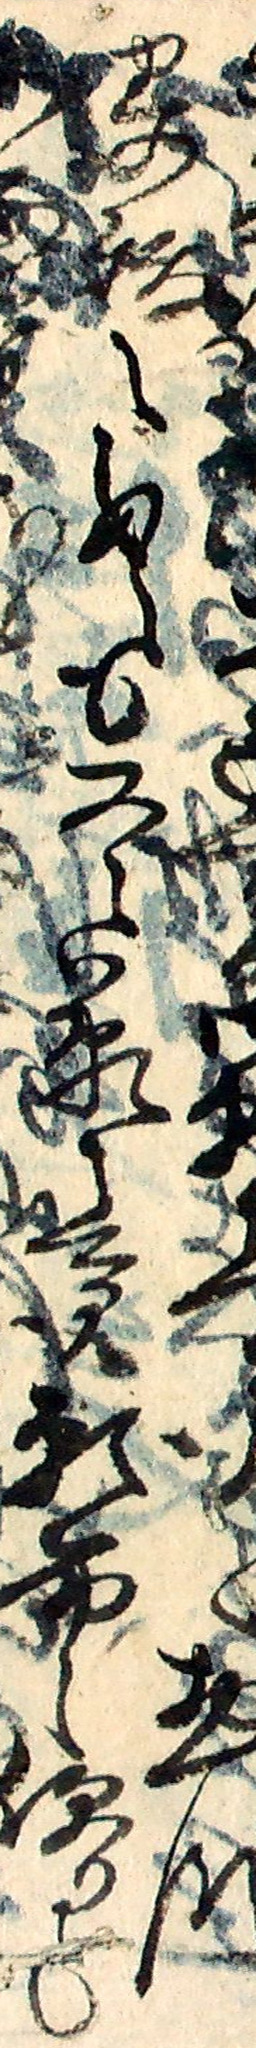寄抜之義にも又々御願申節願筋之便りにも
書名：諸御願書控(後藤氏壱番）
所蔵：鳴門教育大学 Naruto University of Education
